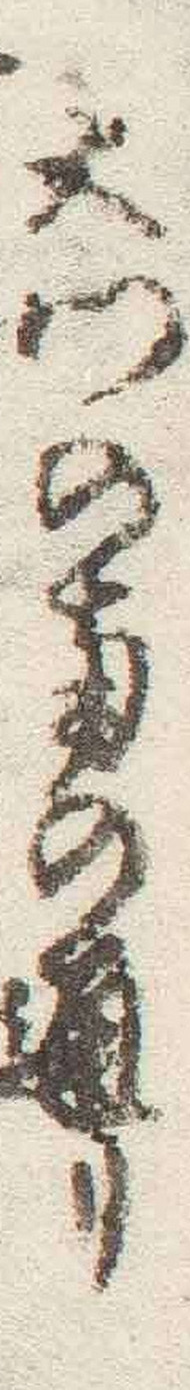大門の南の通り
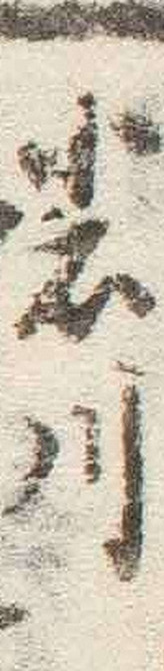小石川
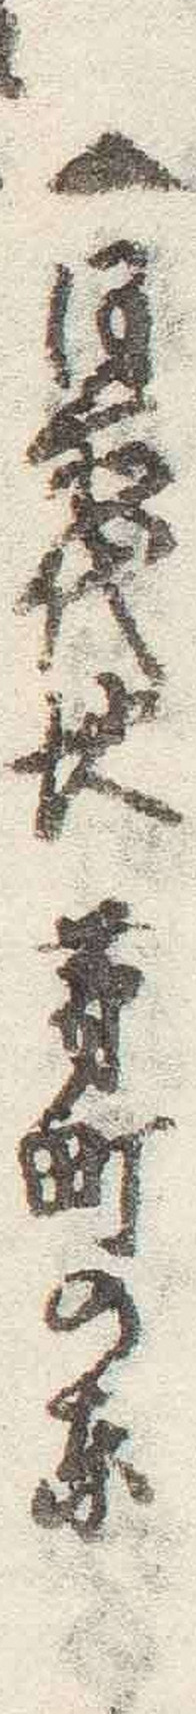▲同所代地茅町の東
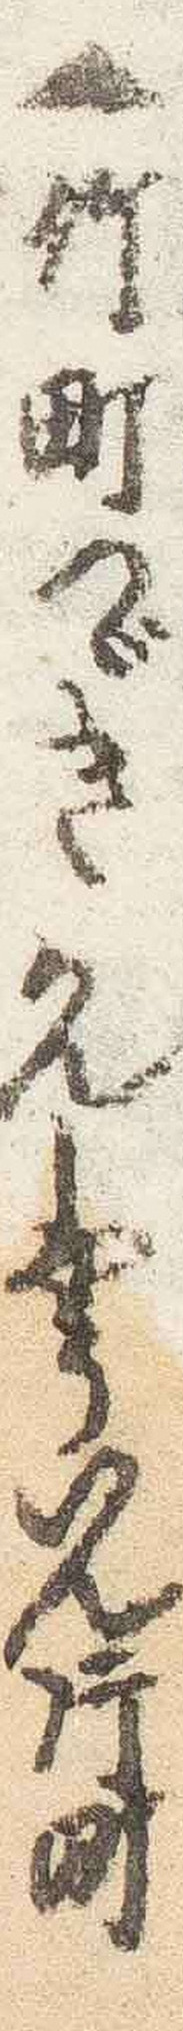▲竹町つゞきかんしやういん片町
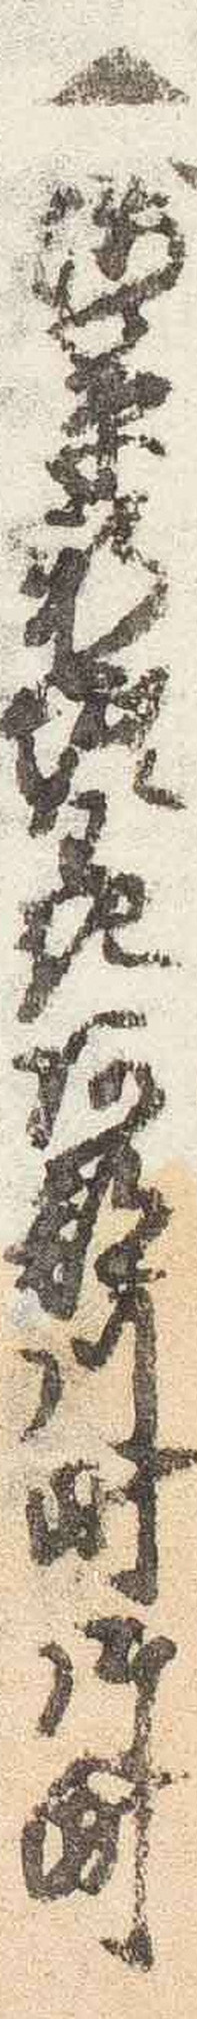▲浅草新堀わき阿部川町片町
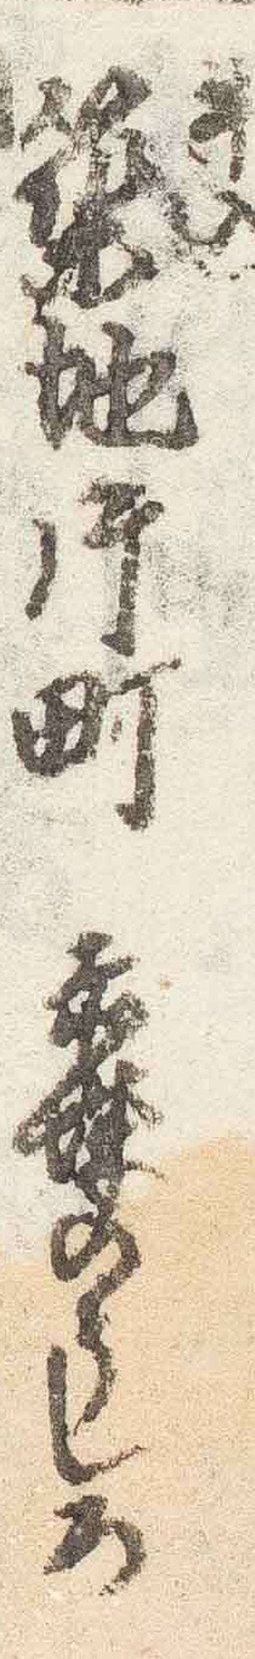築地片町赤城のうしろ
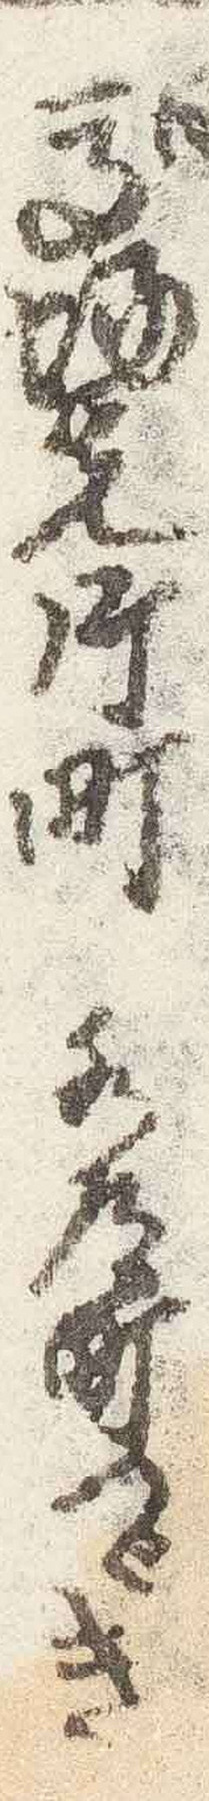馬場先片町水道町つゞき
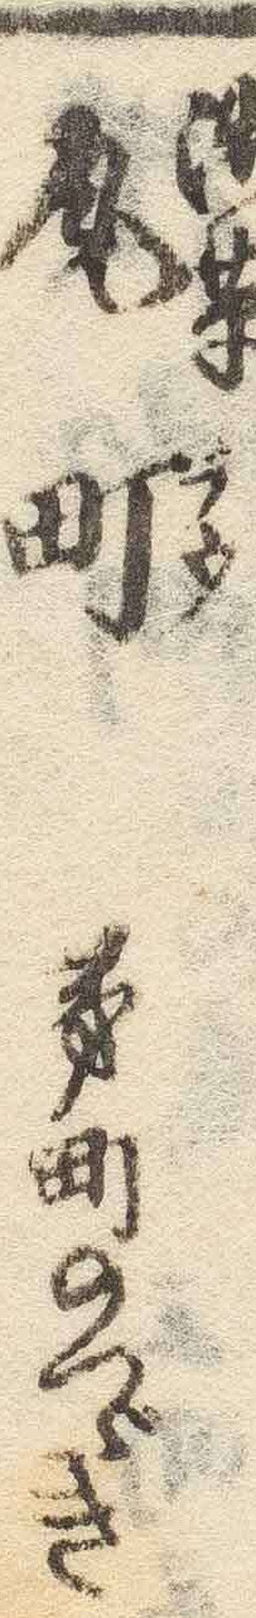瓦町茅町のつゞき
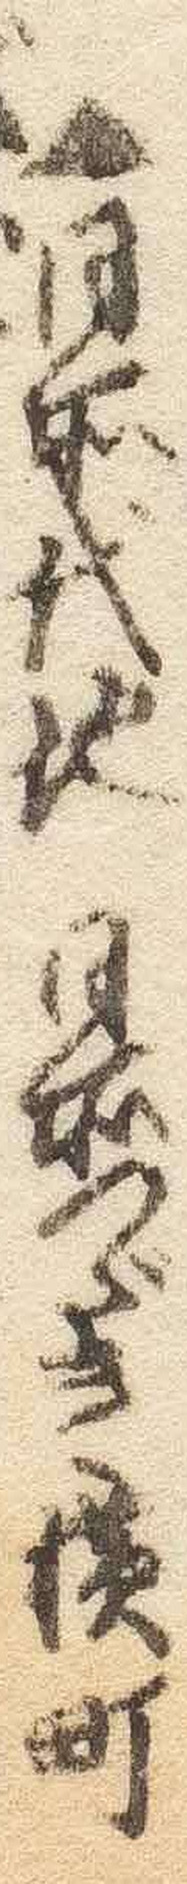▲同所代地同所つゞき横町
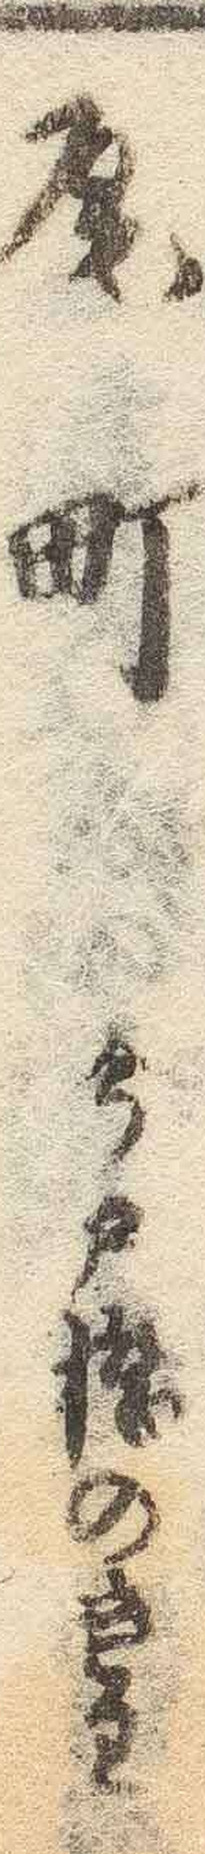瓦町今戸橋のきわ
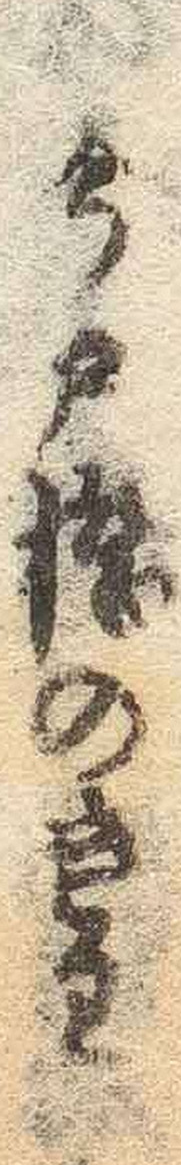瓦町今戸橋のきわ
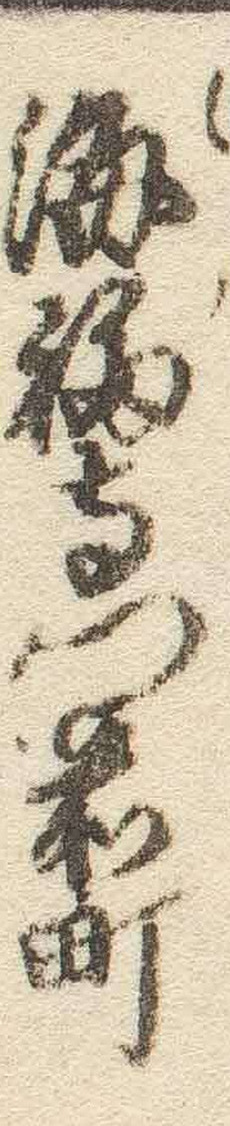海福寺門前町
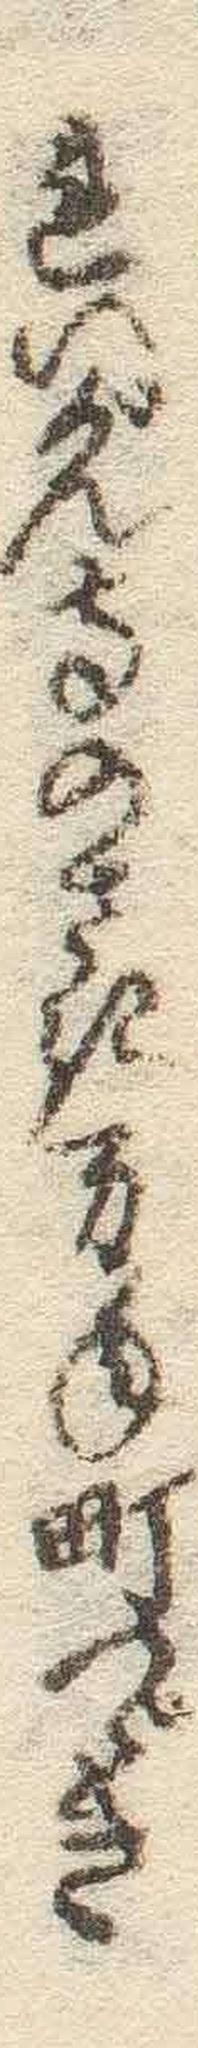れいがん寺のさき万年町つゞき
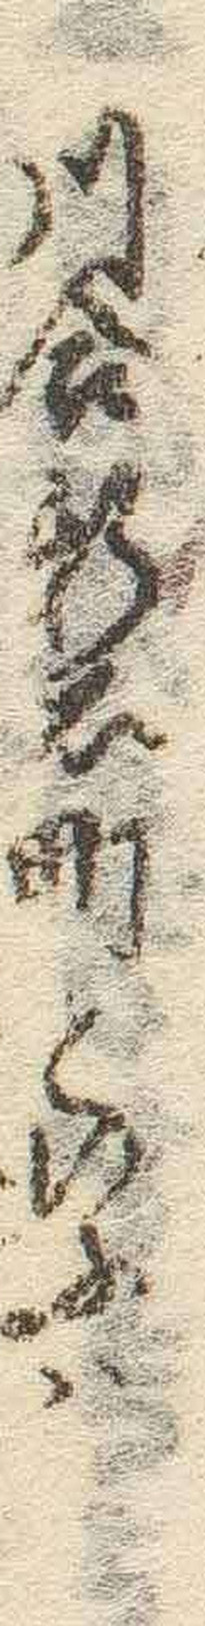川合新石町といふは
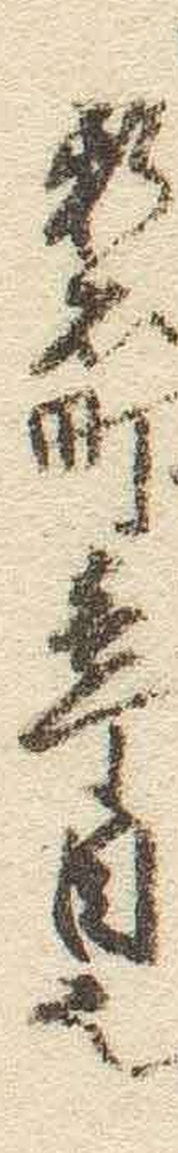新石町壱丁目也
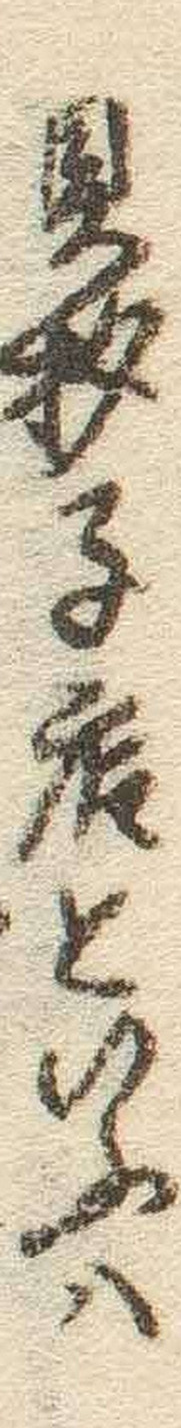貝杓子店といふは
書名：江戸町独案内
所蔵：東京学芸大学附属図書館 国文学研究資料館
